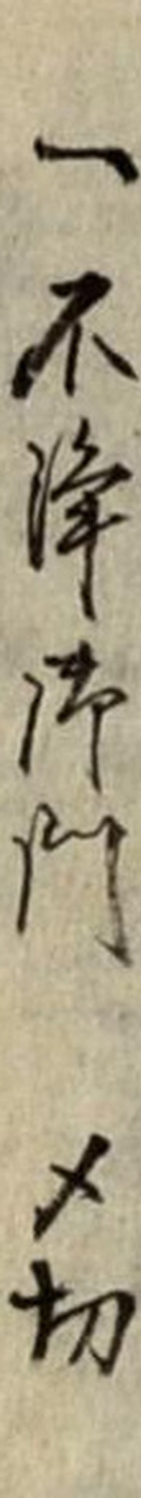一不浄御門〆切
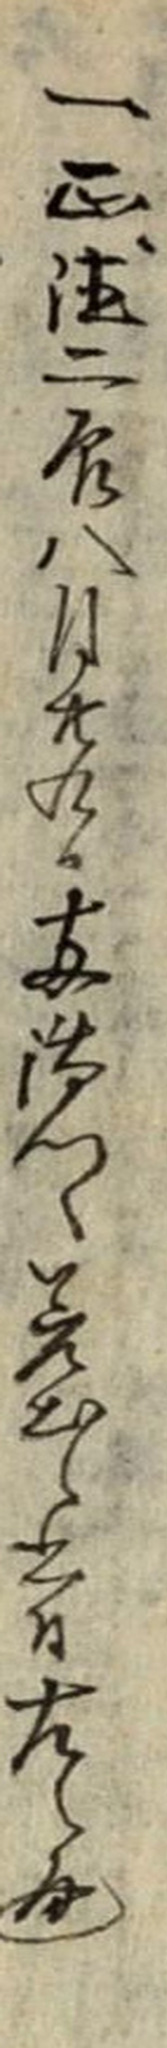一正徳二辰八月廿九日両御門へ差出候書付左之通
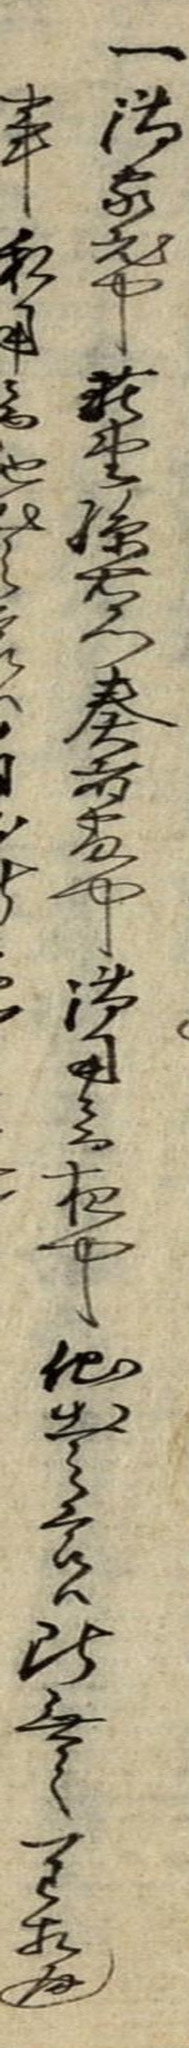一御家老中荻野孫右衛門奏者番中御用にて夜中他出之節は断無之可被相通
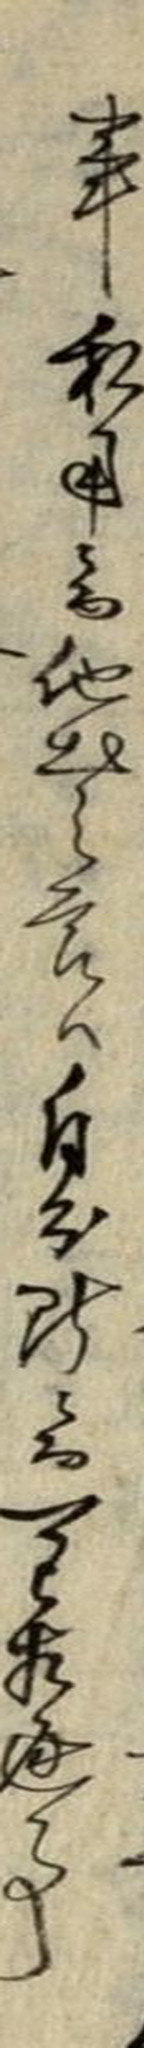事私用にて他出之節は自分断にて可被相通事
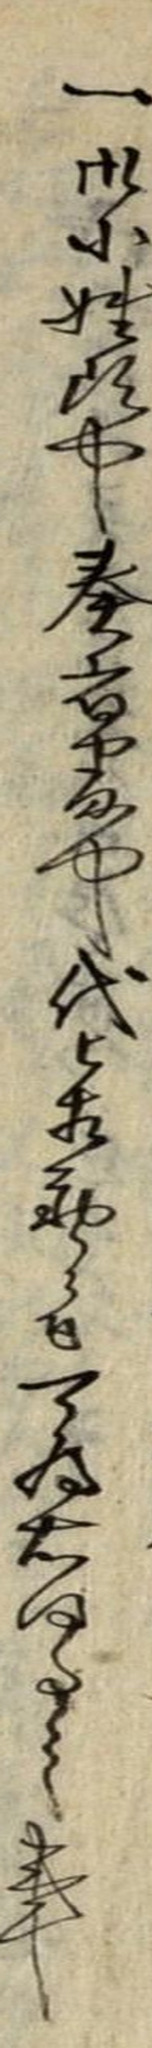一御小姓頭中奏者番中代被相勤候に付可為右伺同事に候事
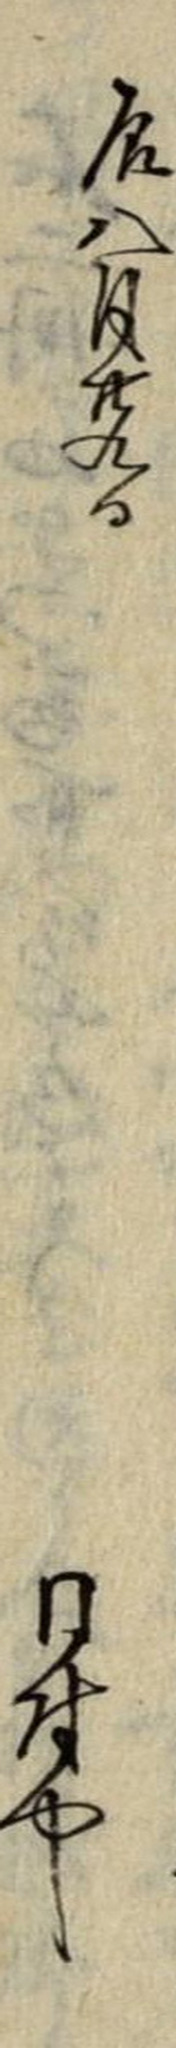辰八月廿九日目付中
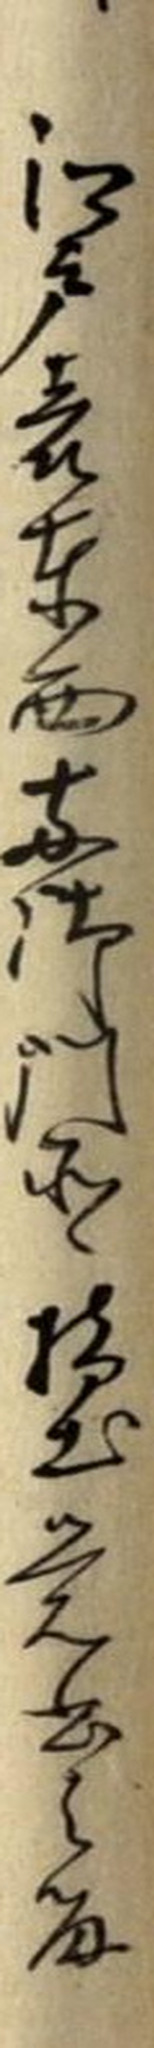一本江戸表東西両御門所へ指出覚書之留
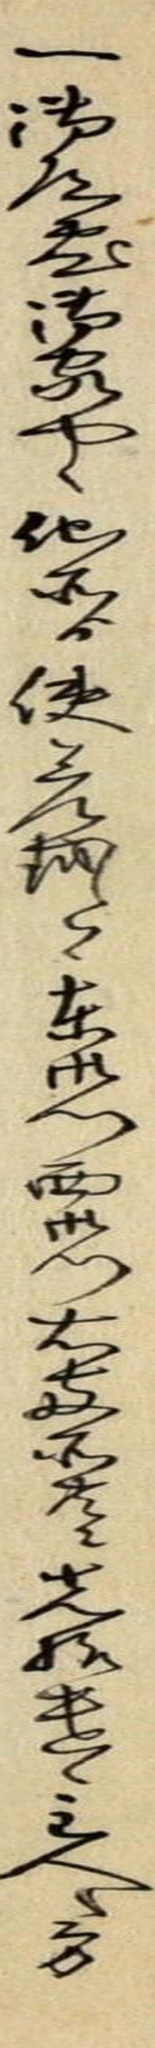一御屋敷御家中へ他所ゟ使差越候はゝ東御門西御門右両所共に先様遣候主人之方
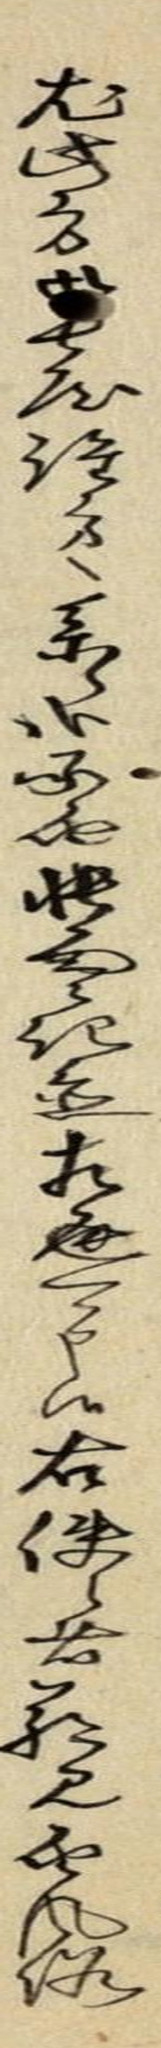尤此方御長屋誰方へ参候哉承届帳面に記置相通可申候右使之者難見届風俗
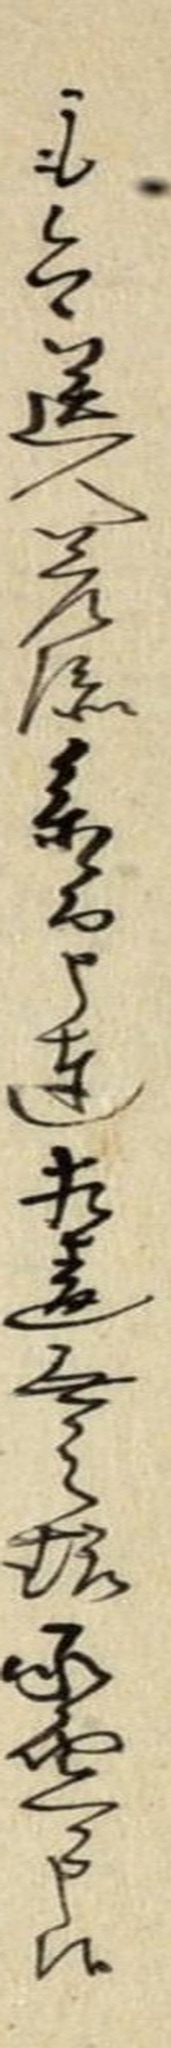にも候はゝ送人差添参候て申達相違無之趣承届可申候
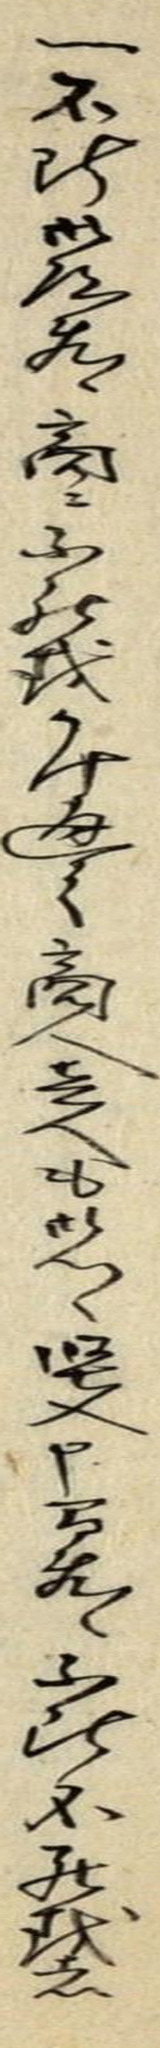一不断御屋敷へ商に不罷越かけ通之商人壱人も御門へ堅入申間敷候不断不罷越者
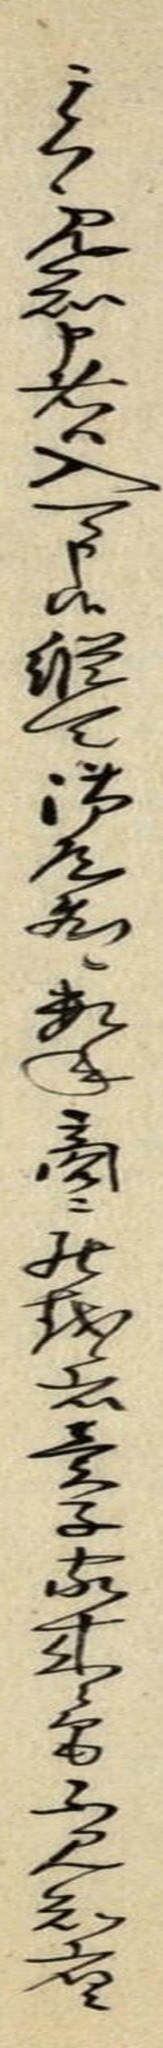に候はゝ見知申者は入可申候縦令御屋敷へ数年商に罷越候者売子家来にても不見知者に
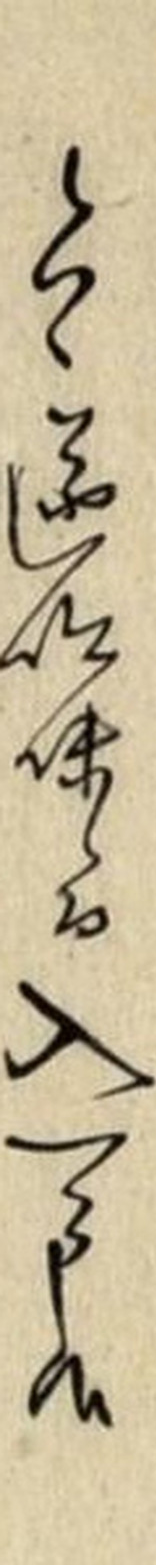候はゝ遂吟味候て入可申候
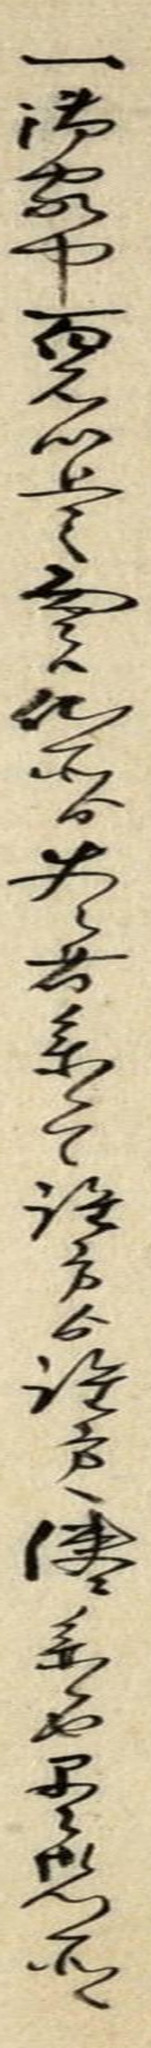一御家中百石以上之面々は他所ゟ使之者参候はゝ誰方ゟ誰方へ使に参候由早々御門所へ
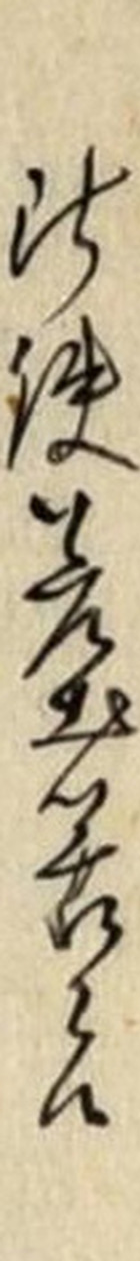断使差出筈に候
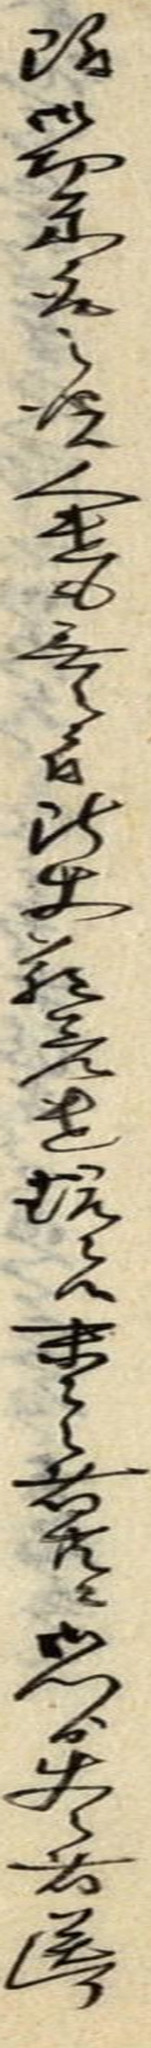附御切米取之儀は人遣も無之候間に付断使難差遣趣に候末々之者共に御門ゟ使之者送り
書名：三都并道中之部
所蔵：福井県文書館 Fukui Prefectural Archives
